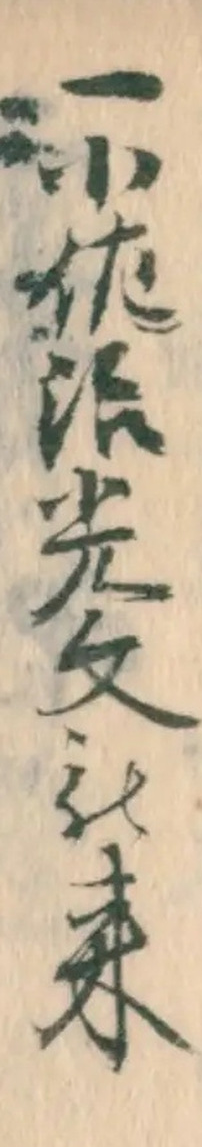一小佐治光文被来
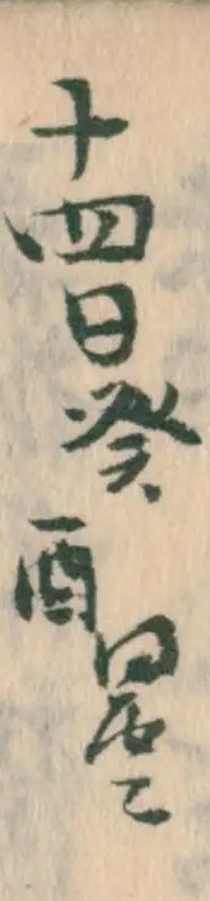十四日癸酉曇
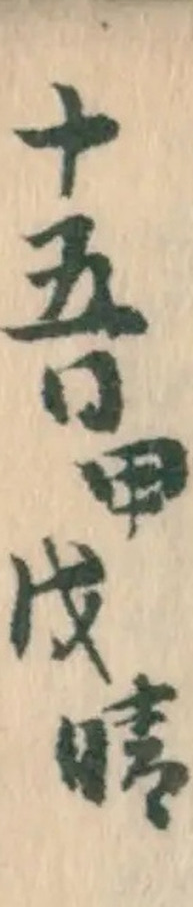十五日甲戌晴
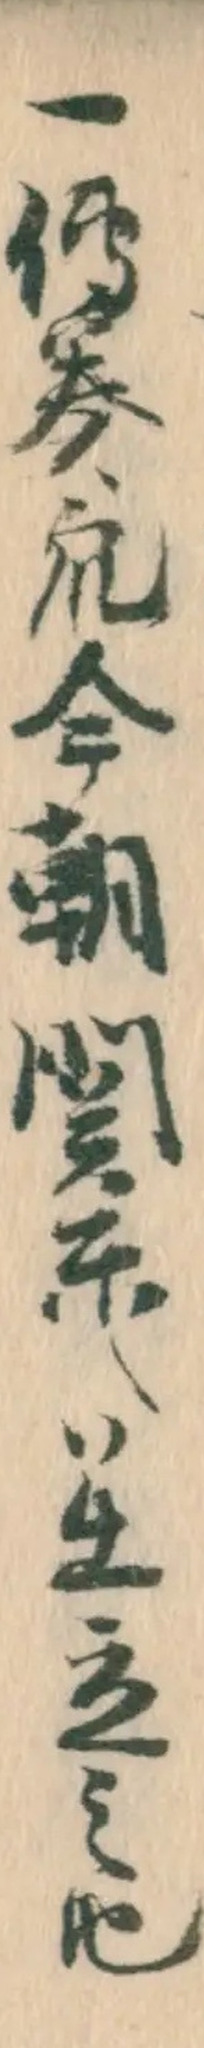一伝奏衆今朝関東へ御出立之由
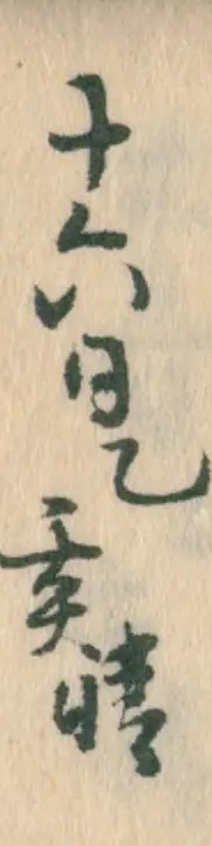十六日乙亥晴
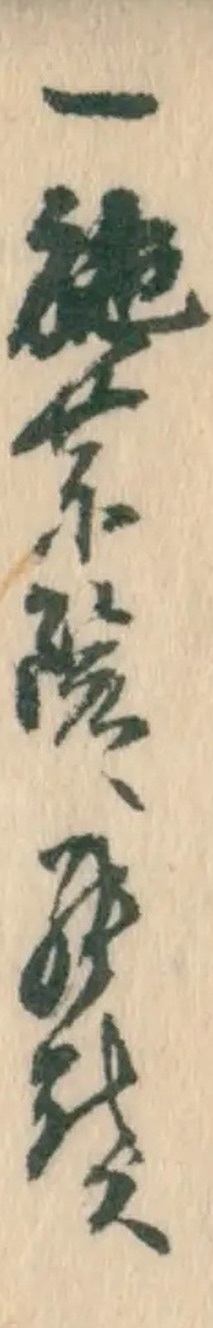一施薬院へ罷越ス
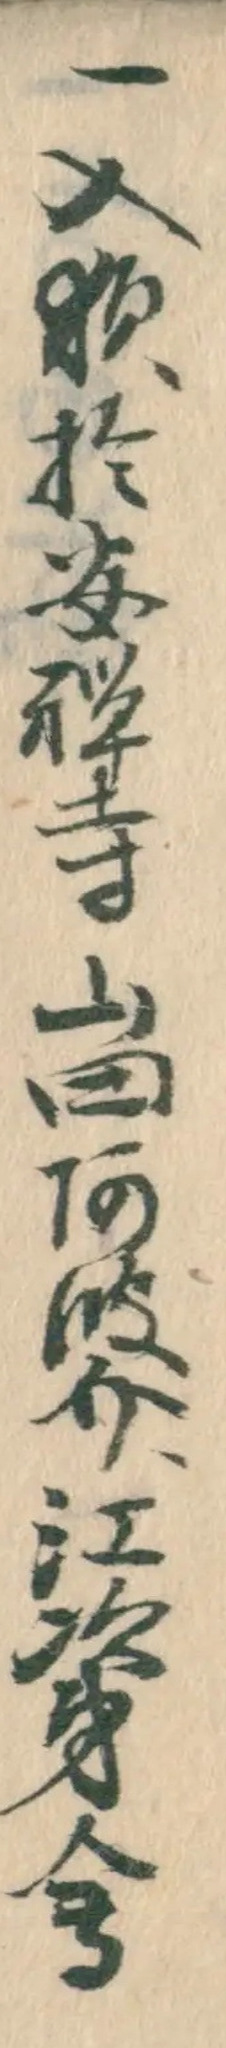一入夜安禅寺山田阿波助江次第会
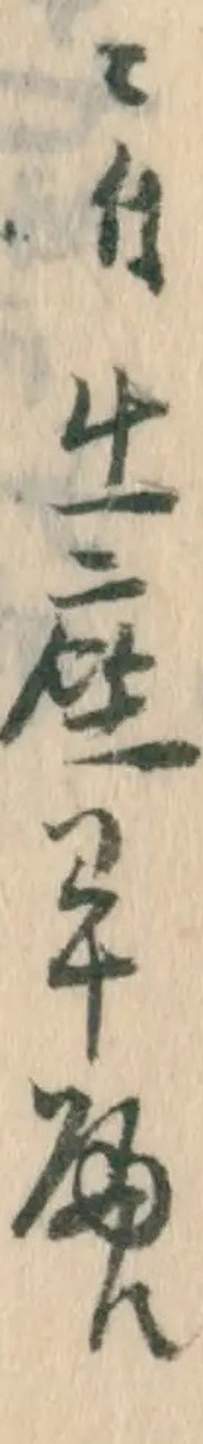ニ付出座畢帰ル

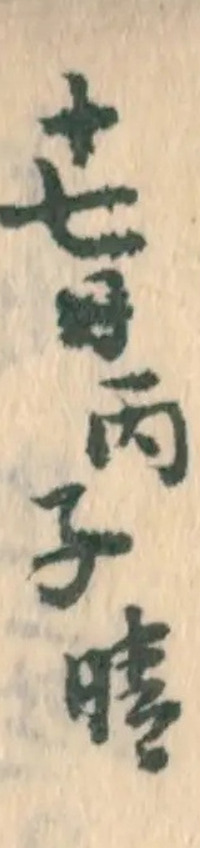十七日丙子晴
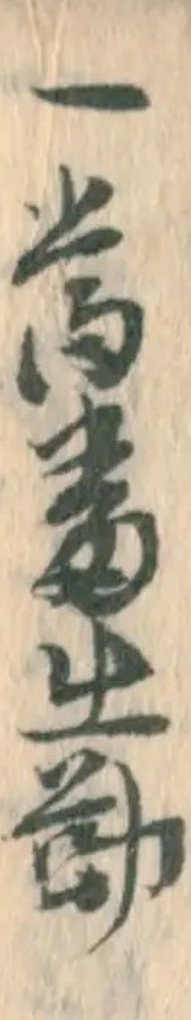一当番出勤
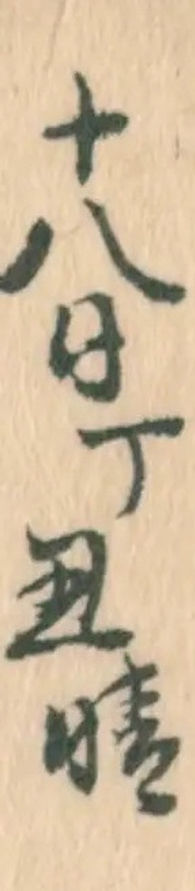十八日丁丑晴
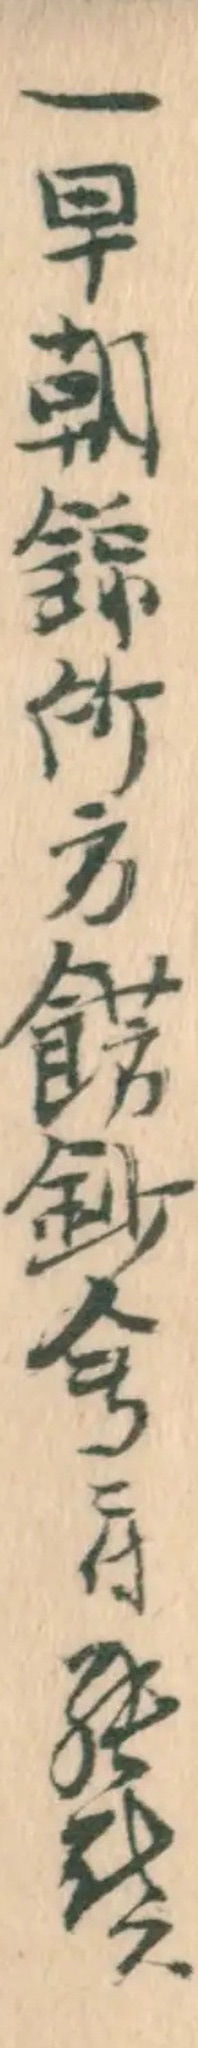一早朝錦所方錺鈔会ニ付罷越ス
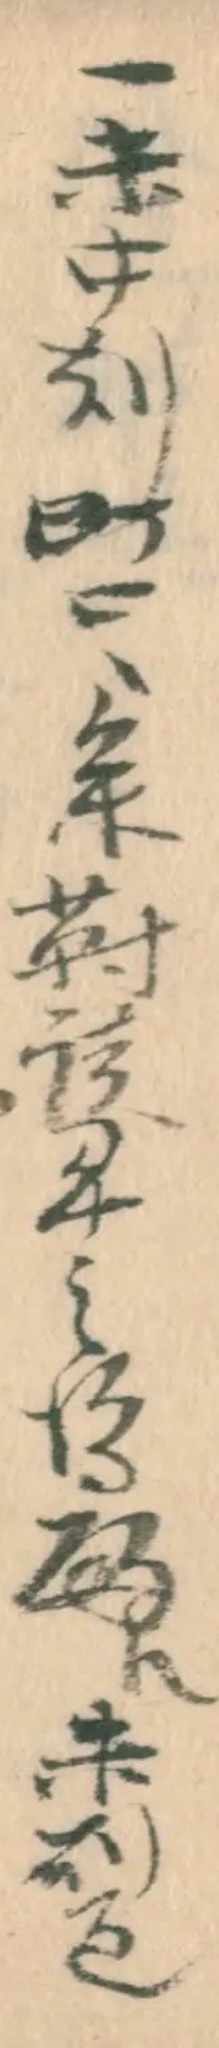一未中刻町口へ参対談畢之後帰ル未刻過
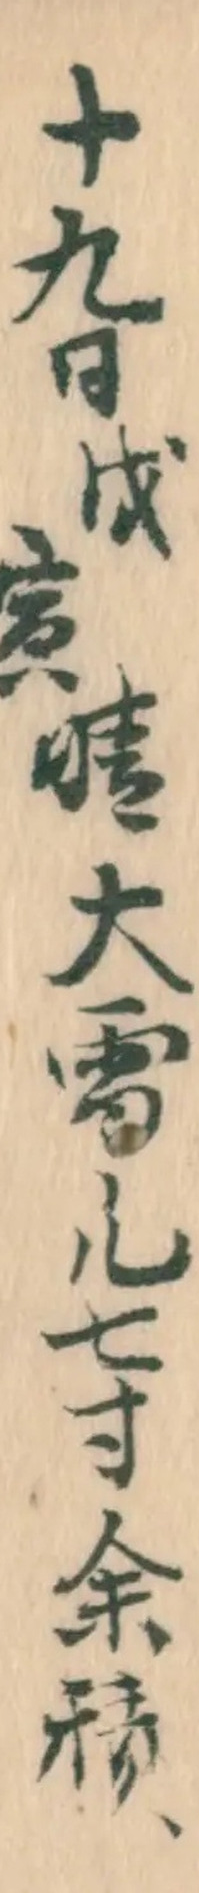十九日戊寅晴大雪凡七寸余積
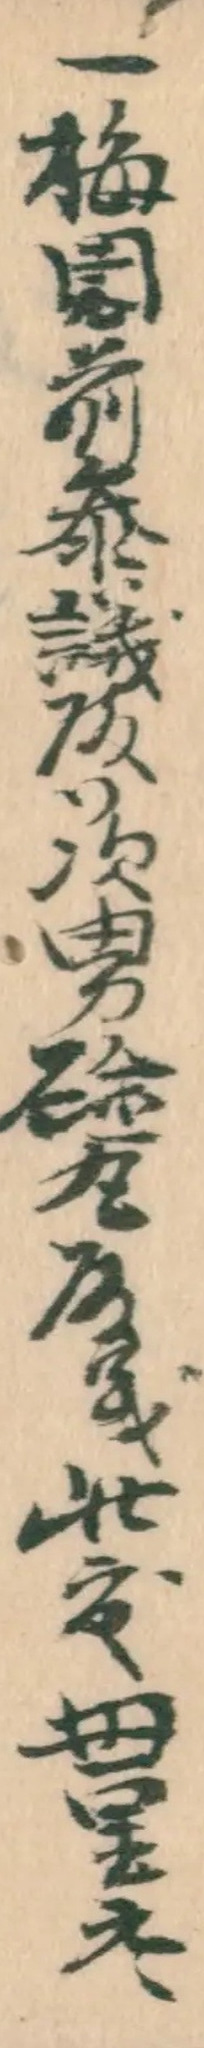一梅園前参議殿御次男碒丸殿義此度母里元へ
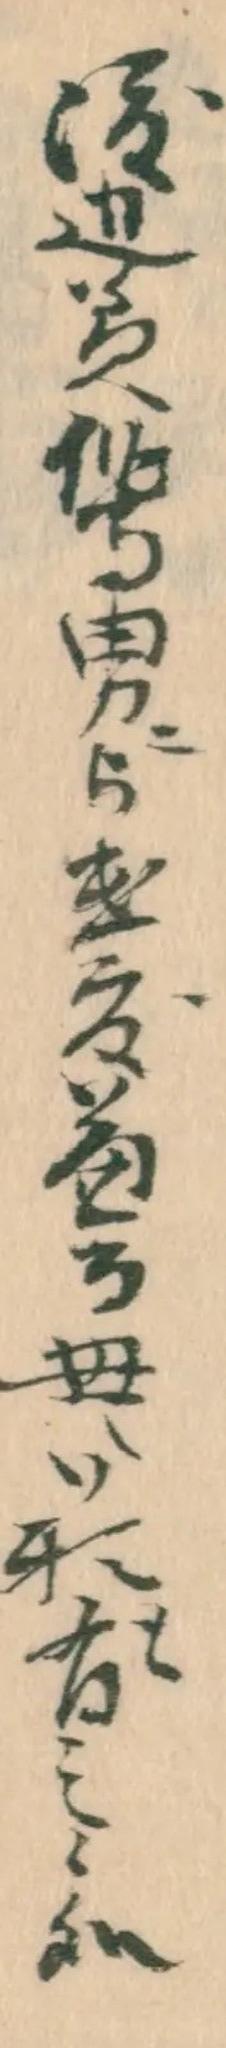渡辺美作守男ニ被遣度兼而母へ御頼と有之候処
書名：禁裏御所御用日記. [131]
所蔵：国立国会図書館 National Diet Library, JAPAN
